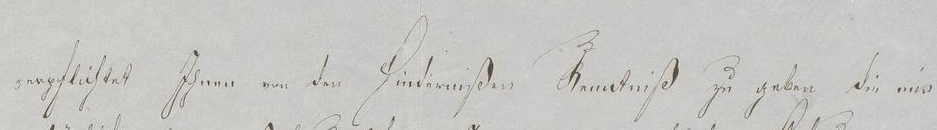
verpflichtet Ihnen von den Hindernnißen Kenntniß zu geben die mir
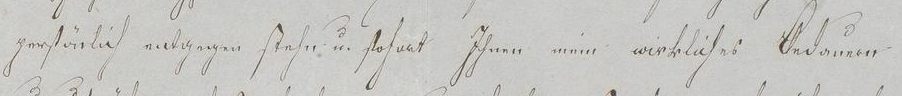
persönlich entgegen stehn u. sofort Ihnen mein wirkliches Bedauern
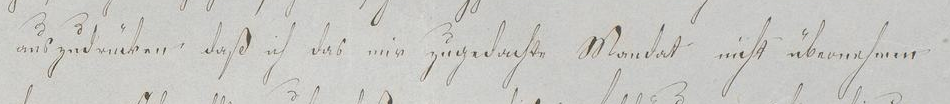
auszudrücken daß ich das mir zugedachte Mandat nicht übernehmen
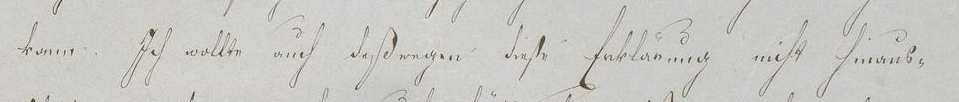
kann. Ich wollte auch deßwegen diese Erklärung nicht hinaus-
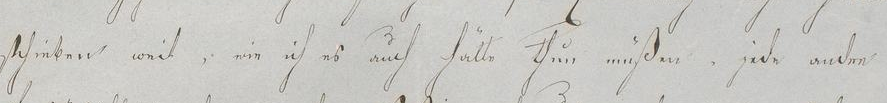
schieben weil, wie ich es auch hätte thun müßen, jede andre
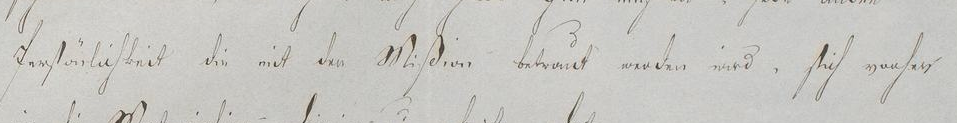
Persönlichkeit die mit der Mißion betraut werden wird, sich vorher
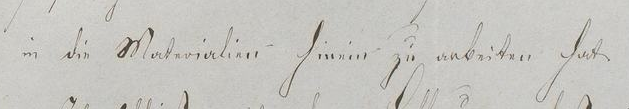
in die Materialien hinein zu arbeiten hat.
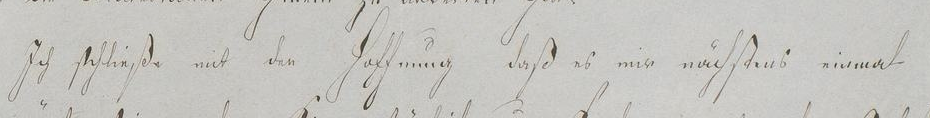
Ich schließe mit der Hoffnung daß es mir nächstens einmal
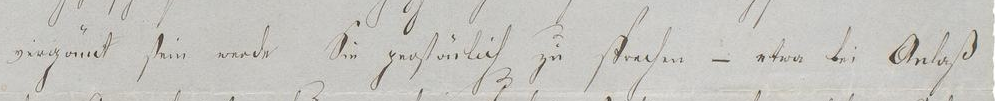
vergönnt sein wird Sie persönlich zu sprechen – etwa bei Anlaß
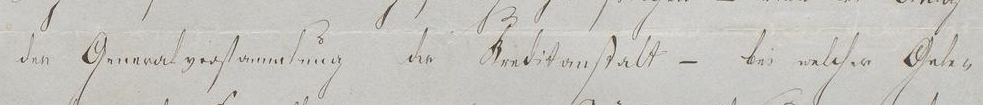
der Generalversammlung der Kreditanstalt – bei welcher Gele-
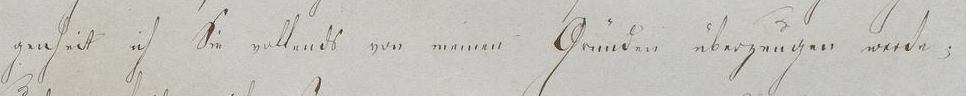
genheit ich Sie vollends von meinen Gründen überzeugen werde;
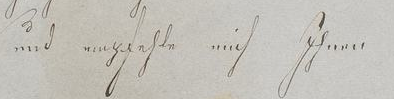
und empfehle mich Ihnen
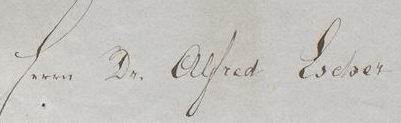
Herrn Dr. Alfred Escher
